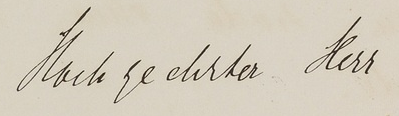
Hochgeehrter Herr
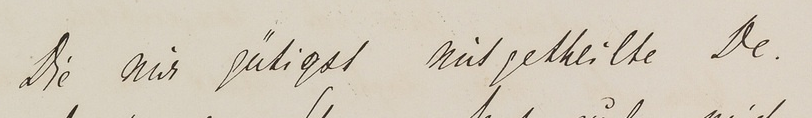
Die mir gütigst mitgehteilte De-
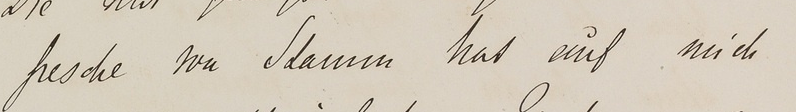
pesche von Stamm hat auf mich
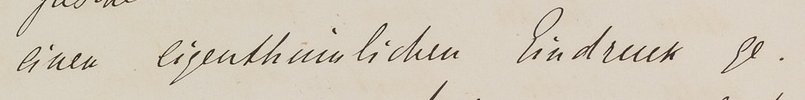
einen eigenthümlichen Eindruck ge-
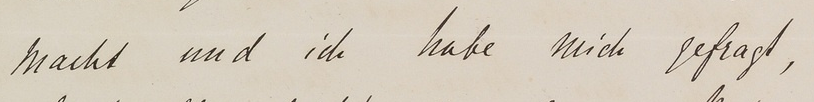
macht und ich habe mich gefragt,
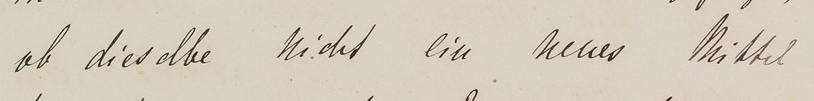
ob dieselbe nicht ein neues Mittel
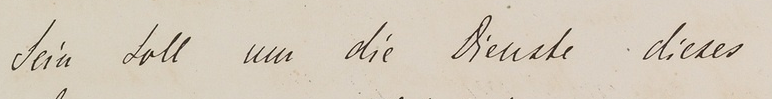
sein soll um die Dienste dieses
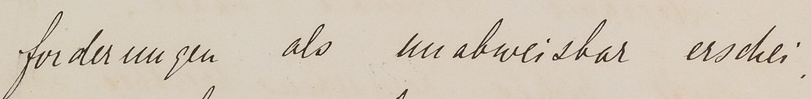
Forderungen als unabweisbar erschei-
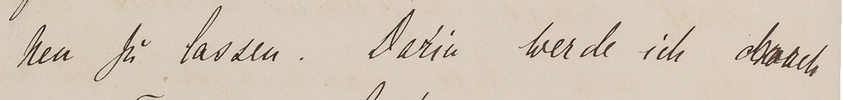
nen zu lassen. Darin werde ich durch
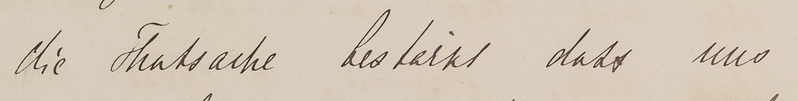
die Thatsache bestärkt dass uns
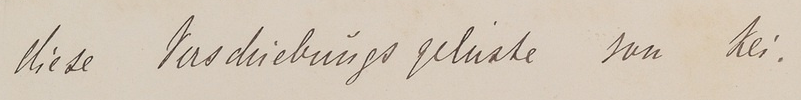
diese Verschiebungsgelüste von kei-
